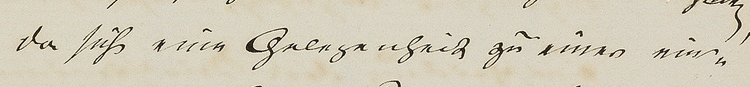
da sich eine Gelegenheit zu einer ein-
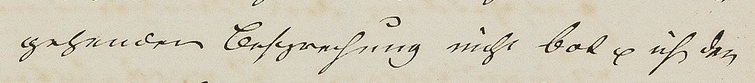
gehenden Besprechung nicht bot & ich den
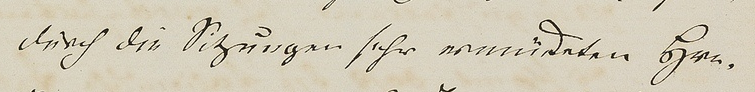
durch die Sitzungen sehr ermüdeten Hrn.
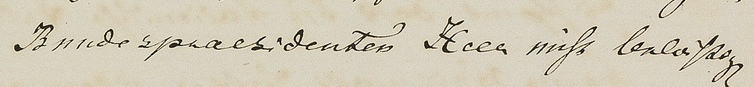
Bundespraesidenten Heer nicht belästigen
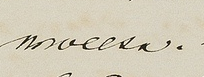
wollte. –
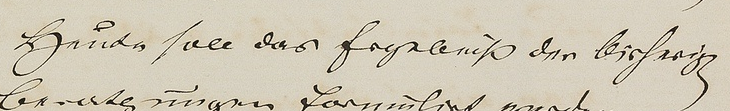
Heute soll das Ergebniß der bisherigen
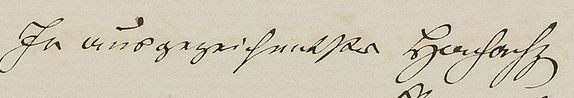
In ausgezeichneter Hochachtung
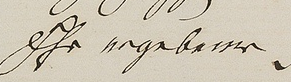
Ihr ergebener
